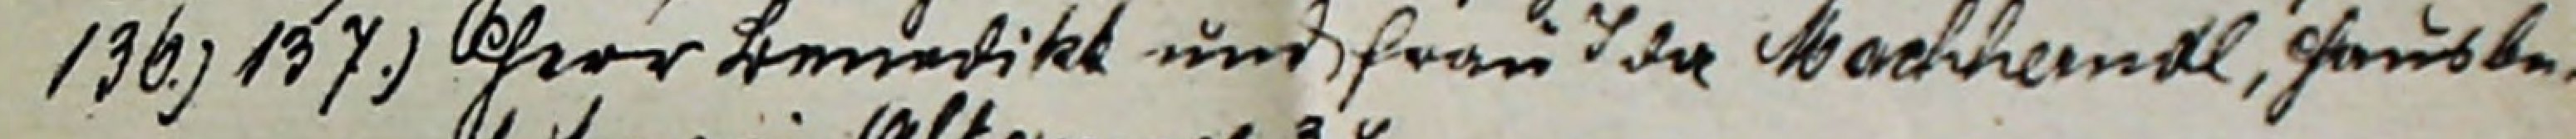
136.) 137.) Herr Benedikt und Frau Ida Machherndl, Hausbe„
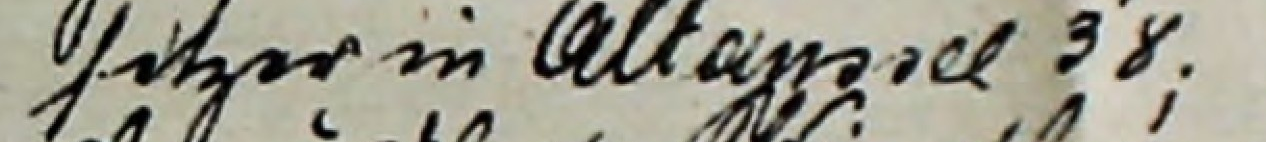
sitzer in Altaussee 38;
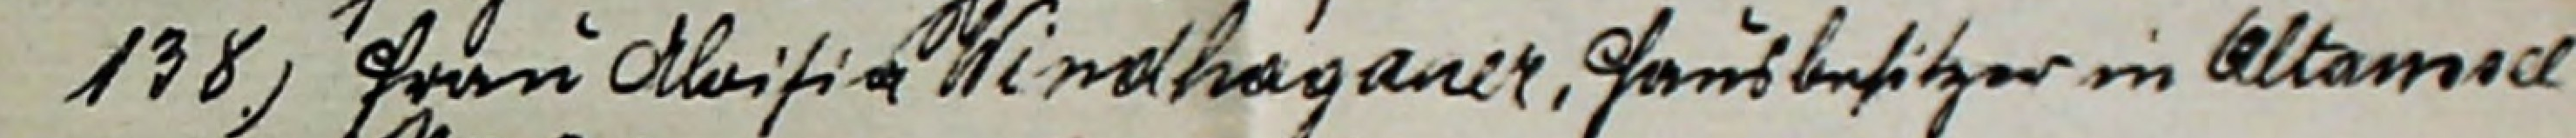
138.) Frau Aloisia Windhaganer, Hausbesitzer in Altaussee
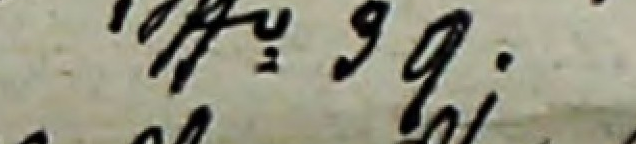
No 39;
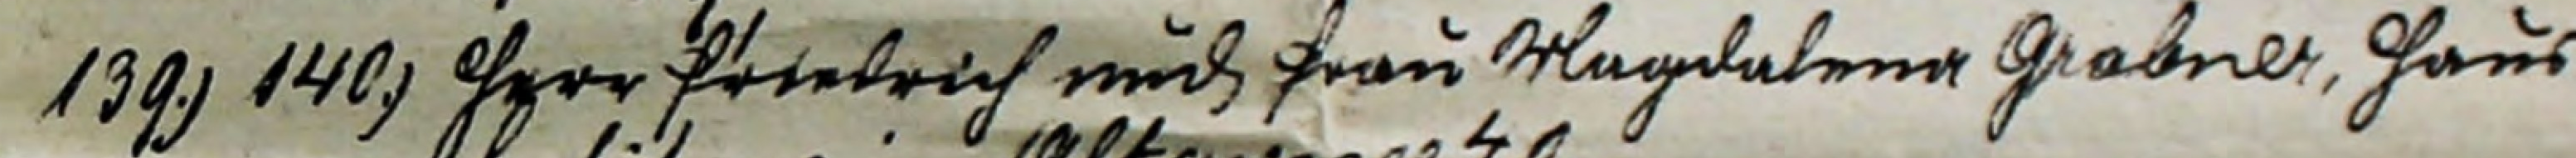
139.) 140.) Herr Friedrich und Frau Magdalena Grabner, Haus?
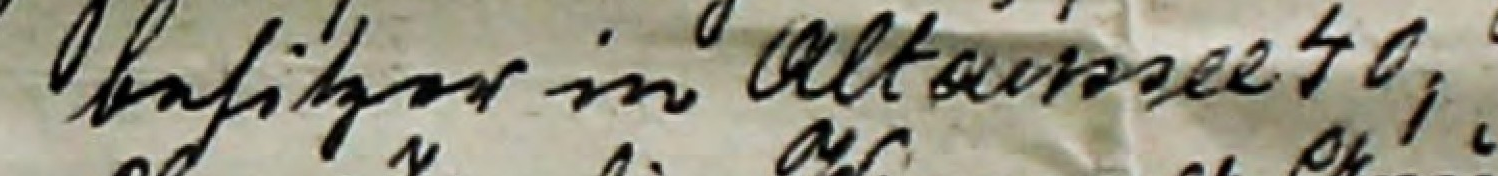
besitzer in Altaussee 40;
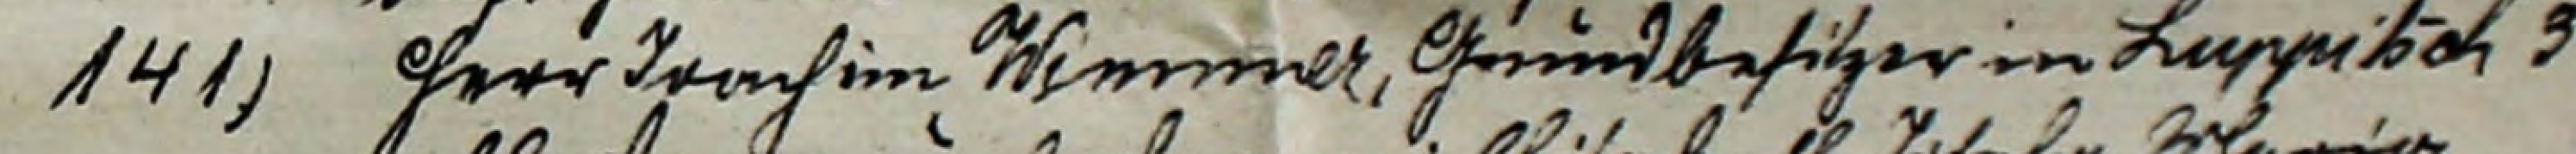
141.) Herr Joachim Wimmer, Grundbesitzer in Luppitsch 3
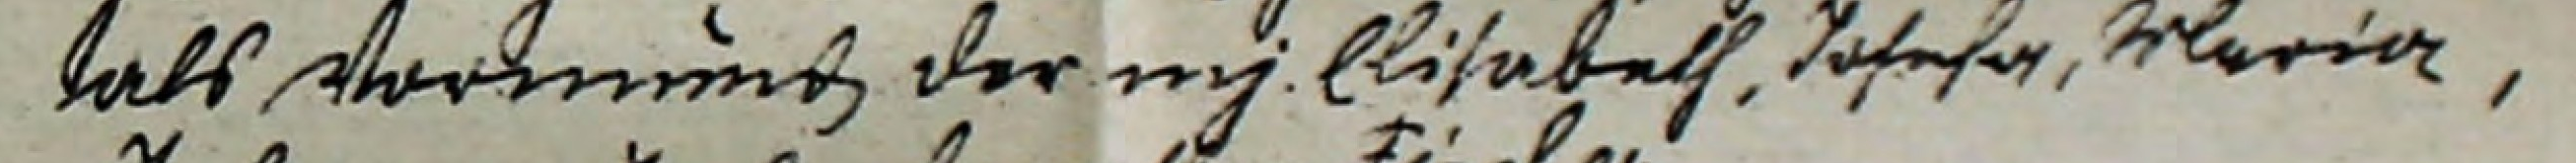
als Vormund der mj. Elisabeth, Josefa, Maria,
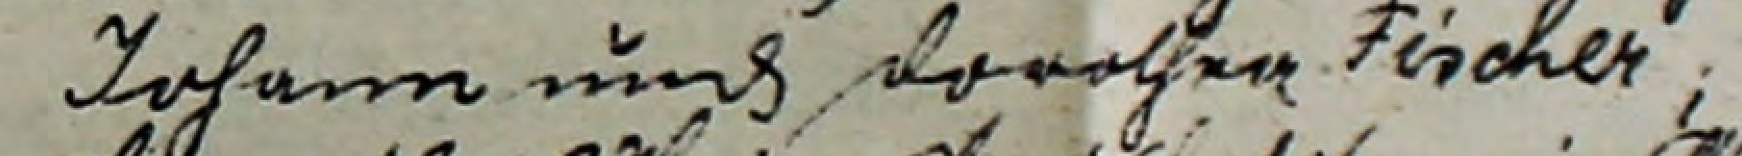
Johann und Dorothea Fischer;
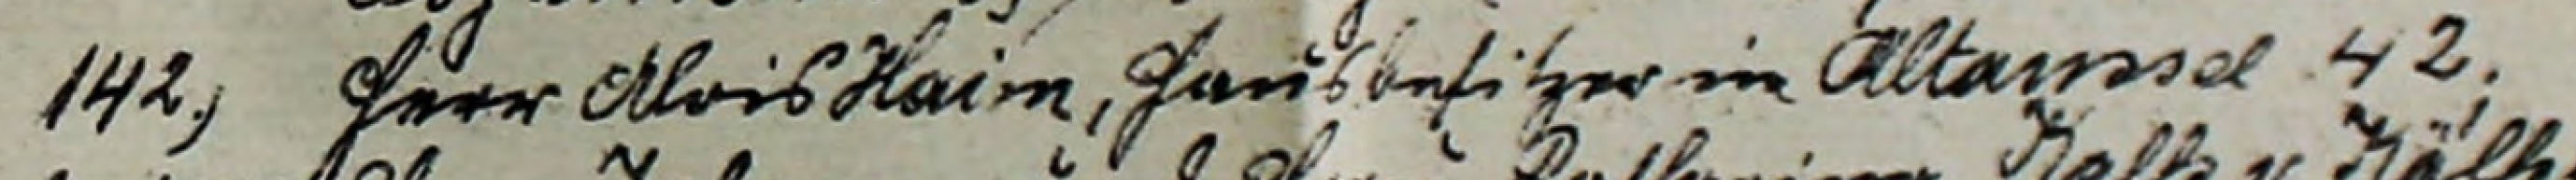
142.) Her Alois Haim, Hausbesitzer in Altaussee 42;
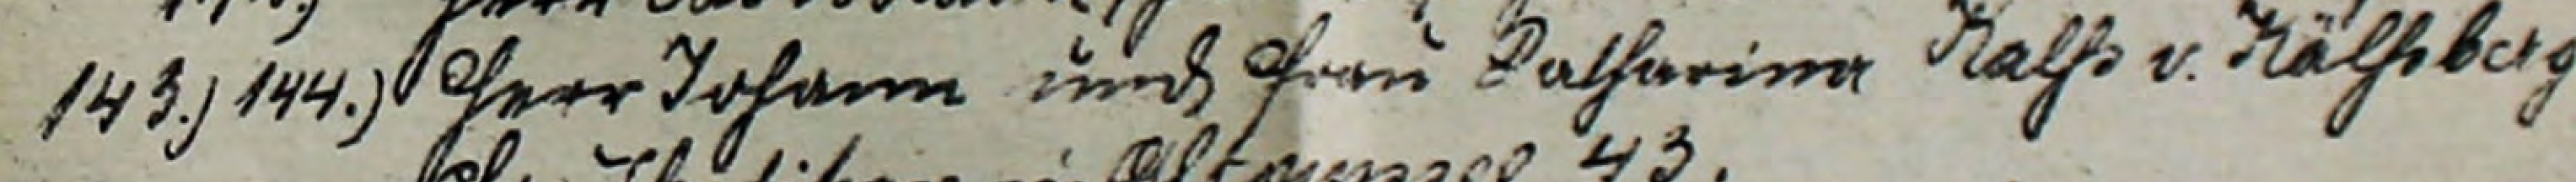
143.) 144.) Herr Johann und Frau Katharina Kalhs v. Kälhsberg
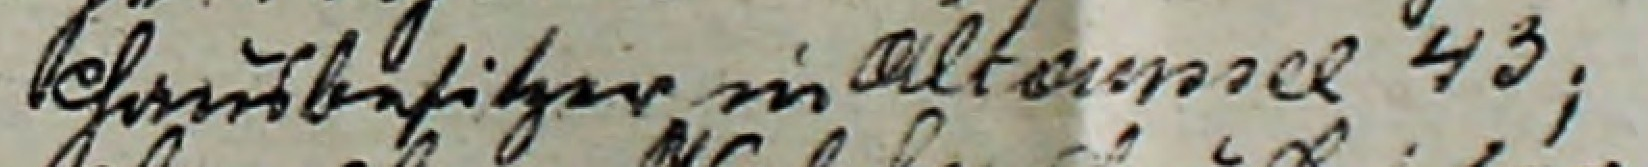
Hausbesitzer in Altaussee 43;
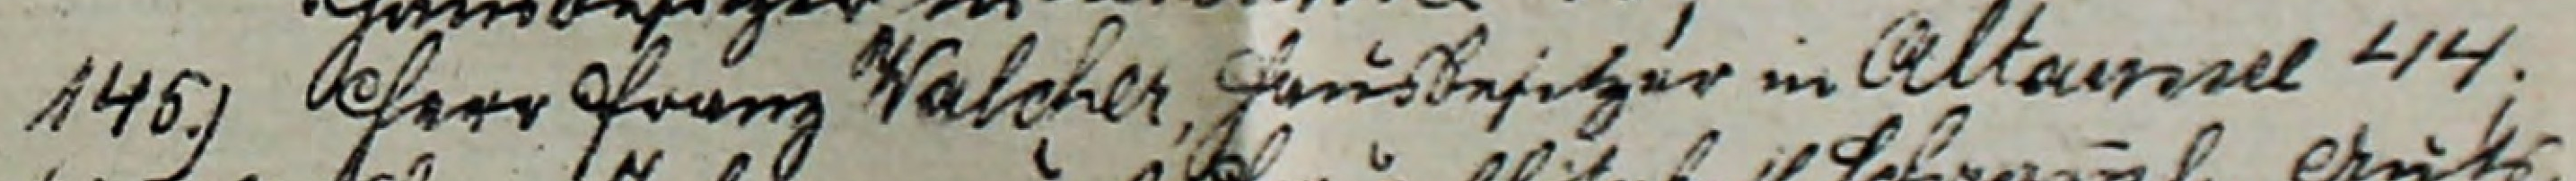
145.) Herr Franz Walcher, Hausbesitzer in Altaussee 44;
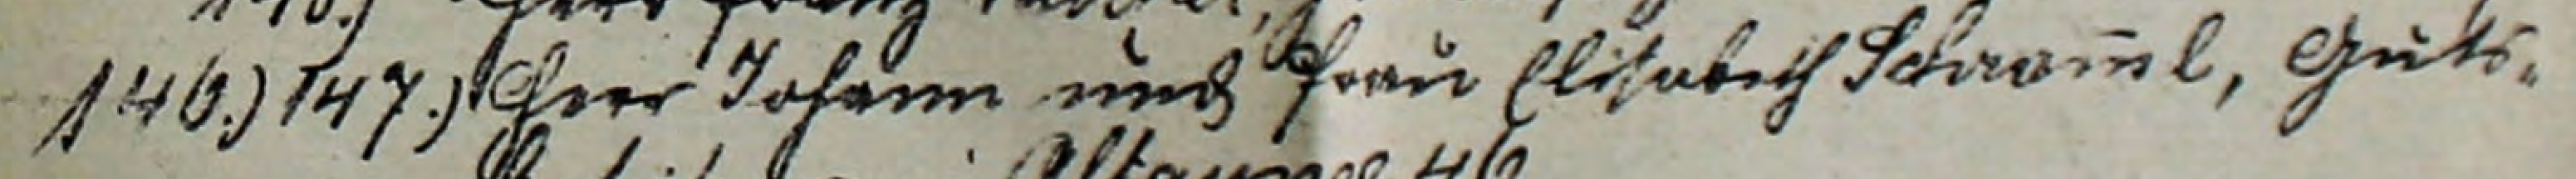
146.) 147.) Herr Johann und Frau Elisabeth Schramml, Guts„
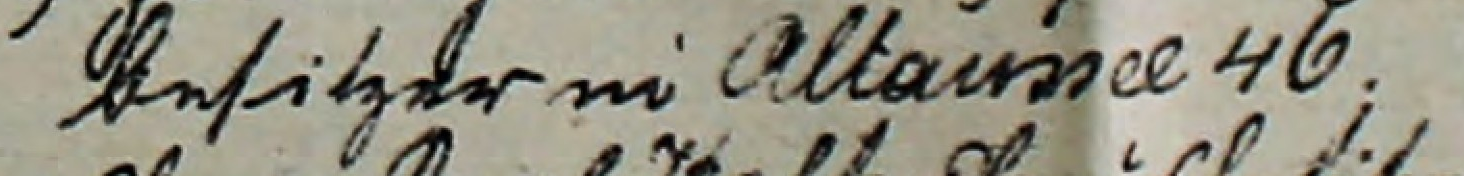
besitzer in Altaussee 46;
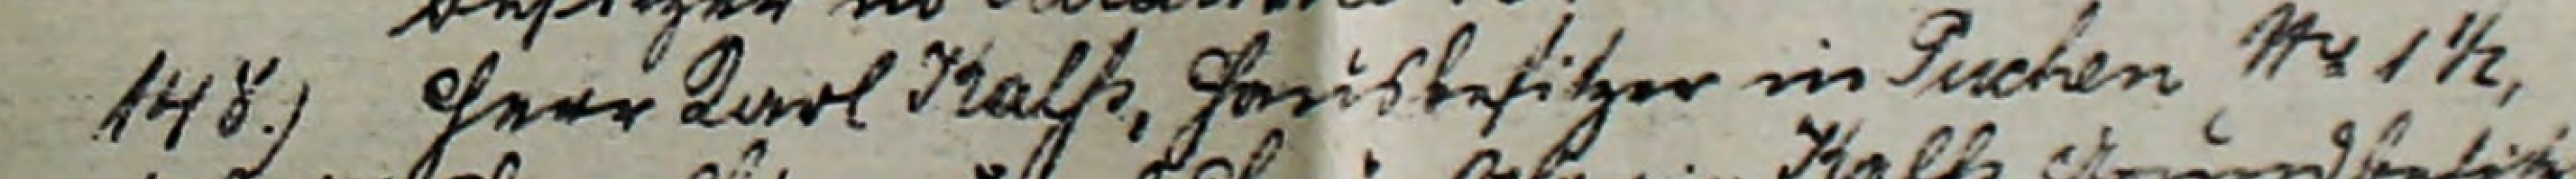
148.) Herr Karl Kalhs, Hausbesitzer in Puchen No 1 1/2,
